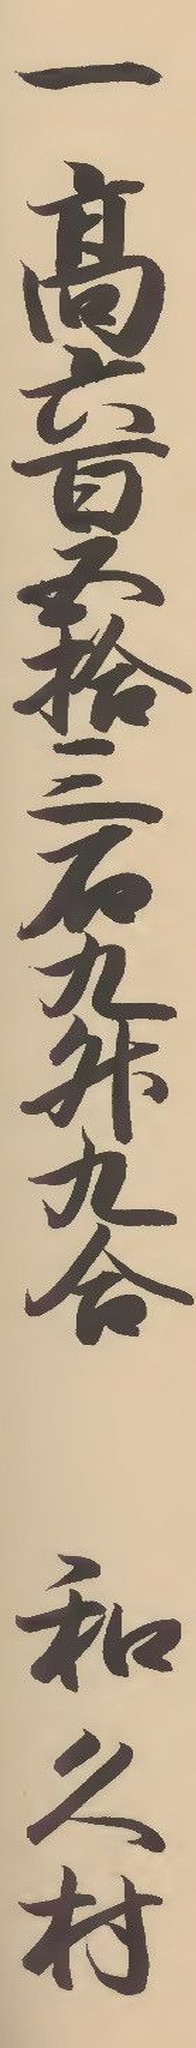一高六百五拾三石九升九合和久村
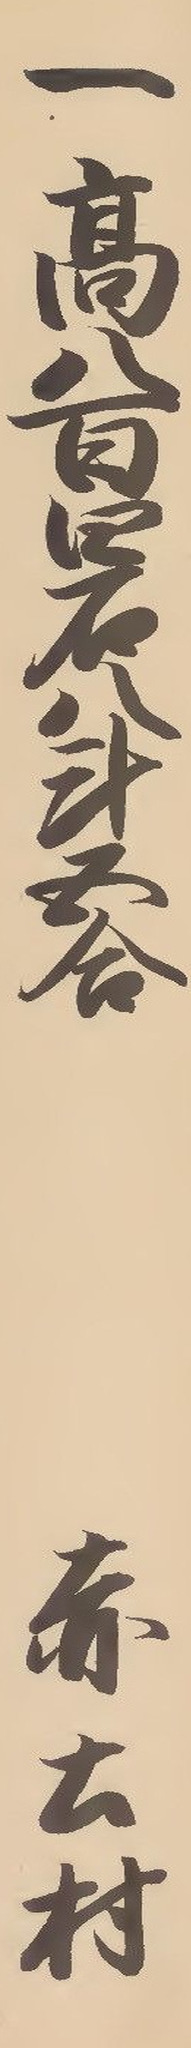一高八百四石八斗五合赤土村
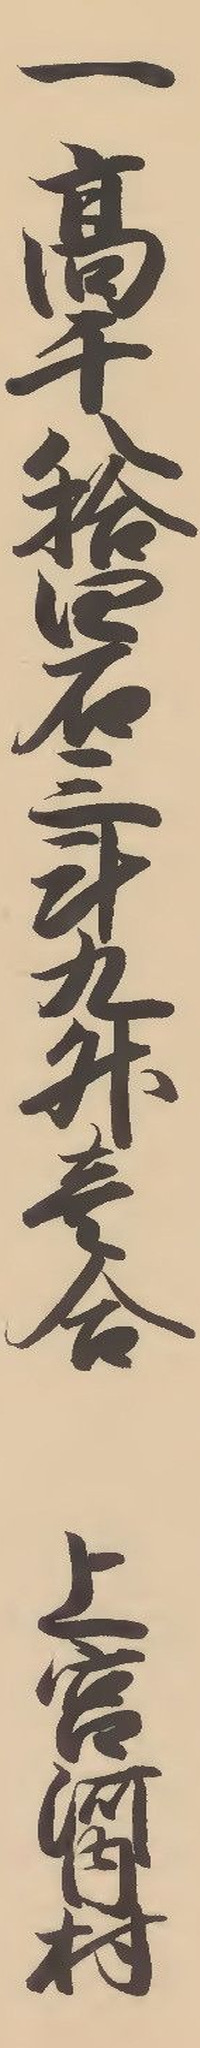一高千八拾四石三斗九升壱合上宮河内村
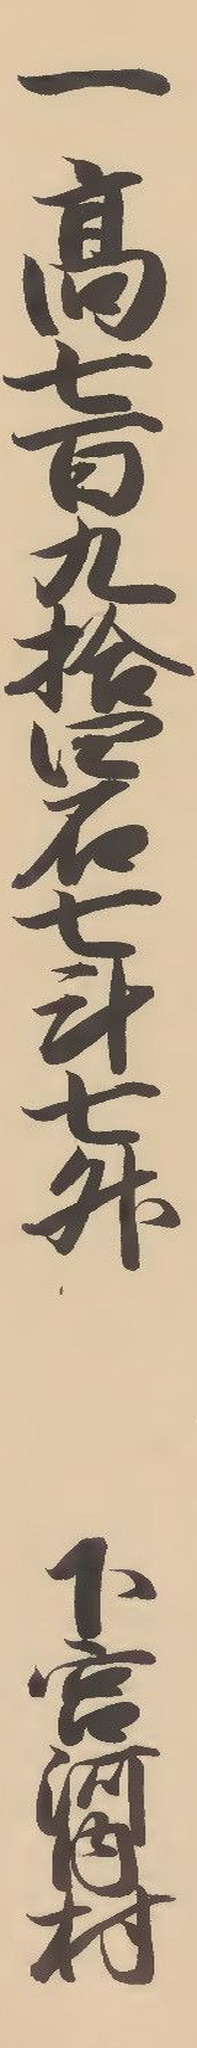一高七百九拾四石七斗七升下宮河内村
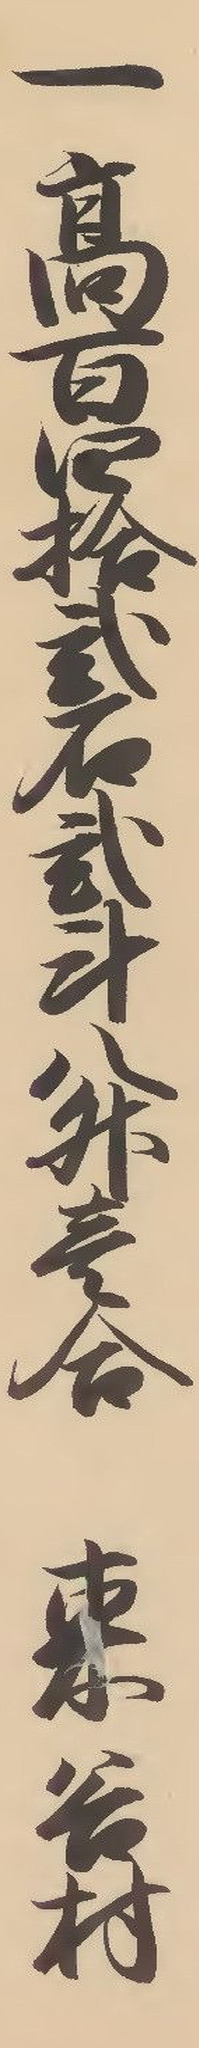一高百四拾弐石弐斗八升壱合東谷村

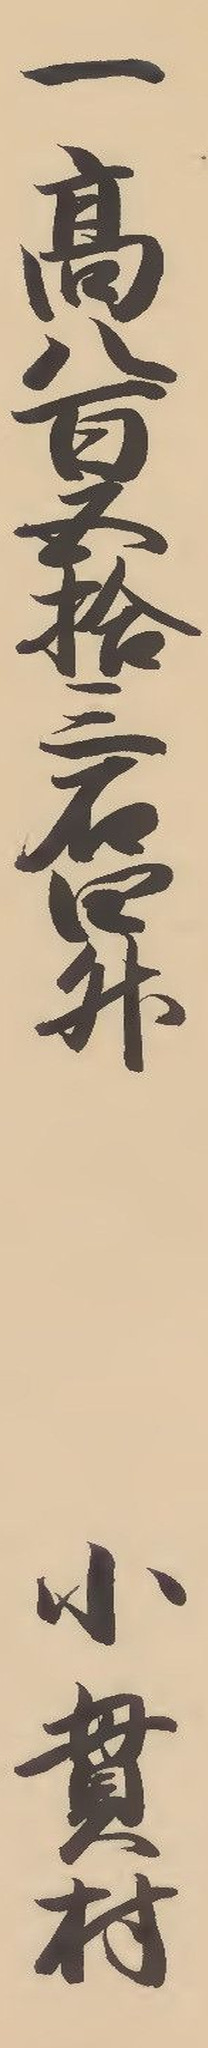一高八百五拾三石四升小貫村
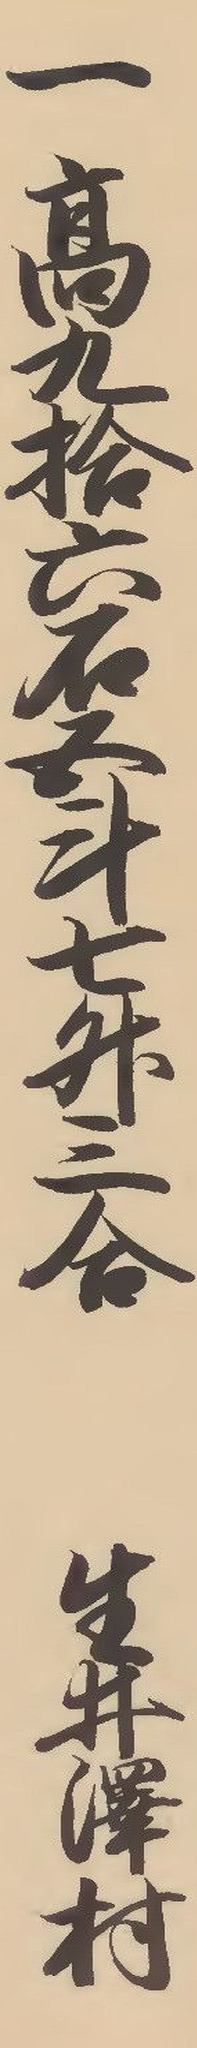一高九拾六石五斗七升三合生井沢村
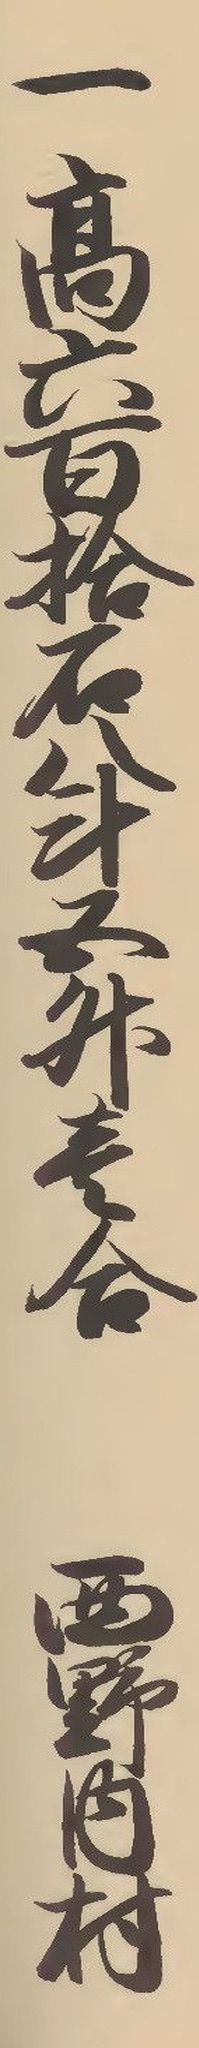一高六百拾石八斗五升壱合西野内村
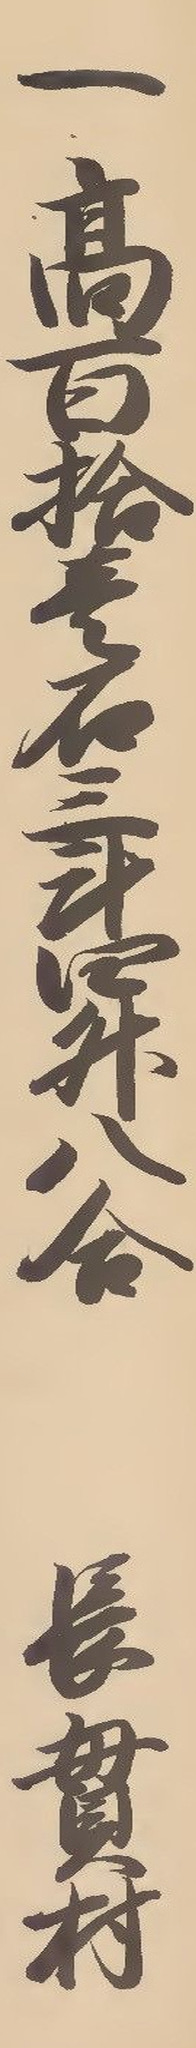一高百拾壱石三斗四升八合長貫村
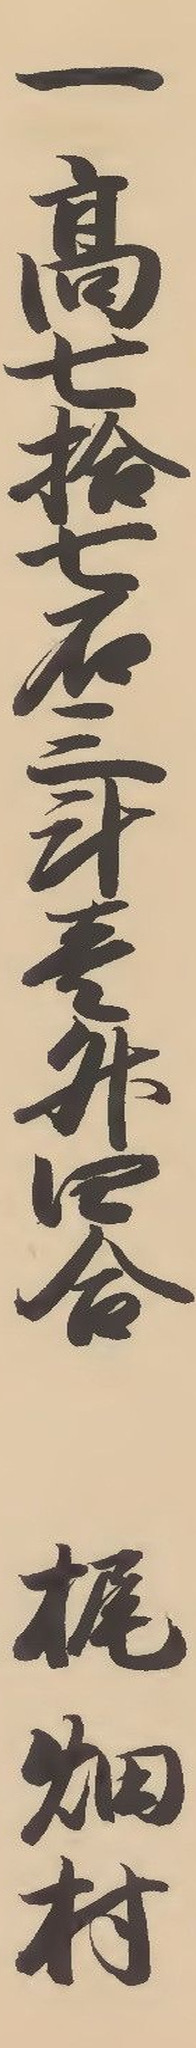一高七拾七石三斗壱升四合梶畑村
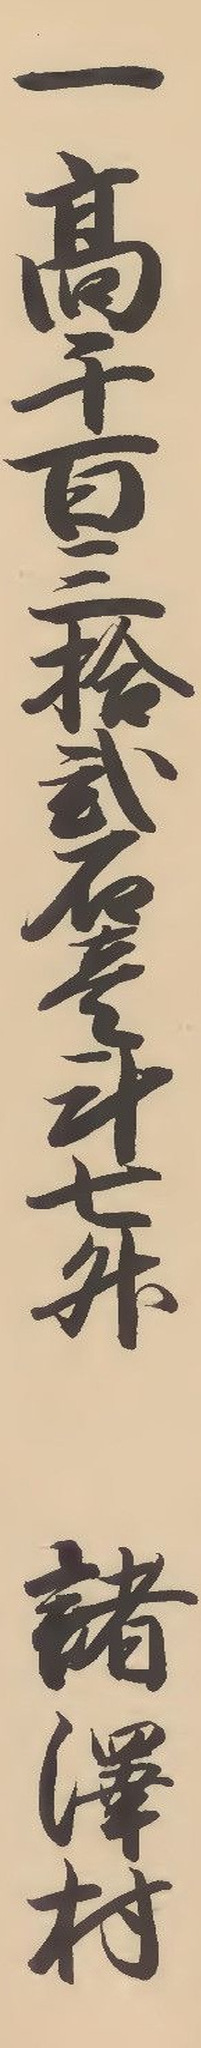一高千百三拾弐石壱斗七升諸沢村
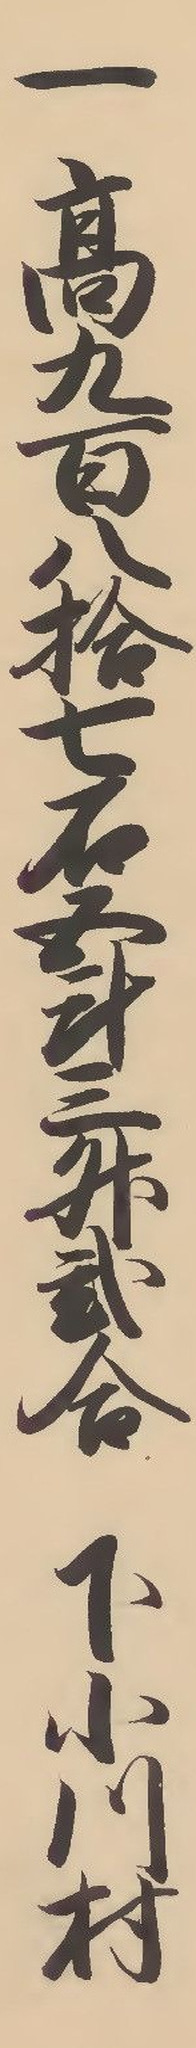一高九百八拾七石五斗三升弐合下小川村

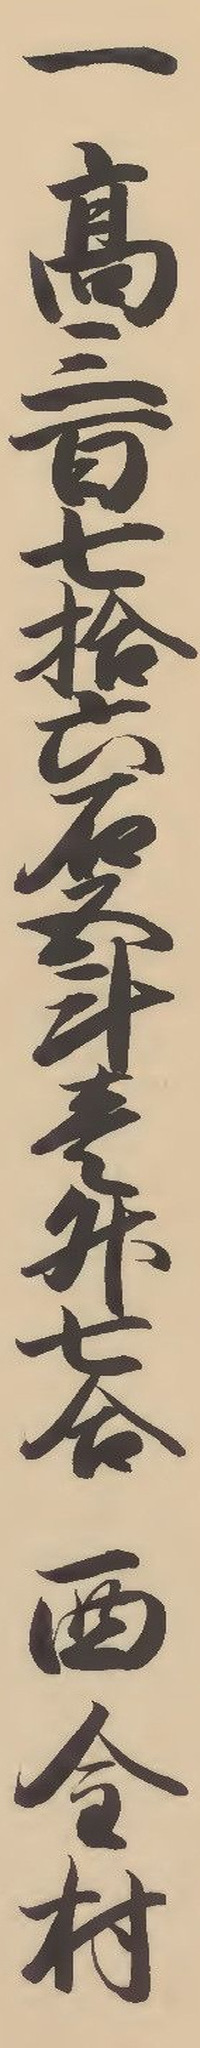一高三百七拾六石五斗壱升七合西金村
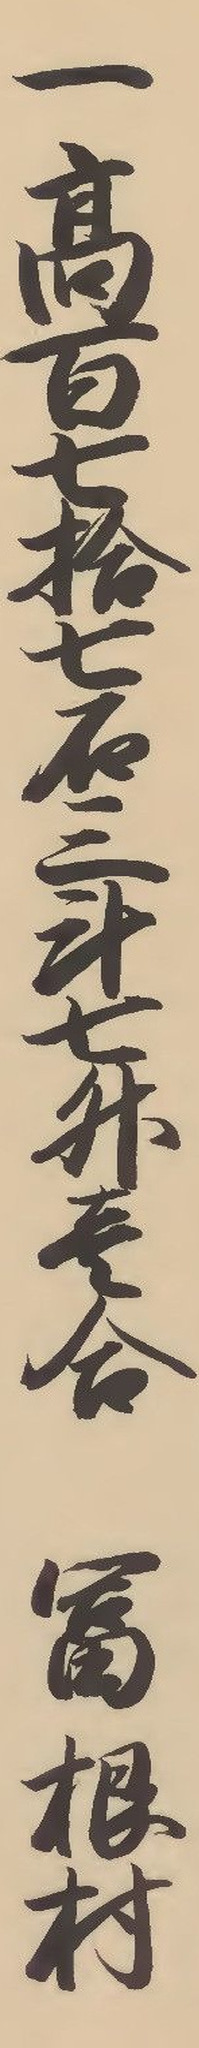一高百七拾七石三斗七升壱合富根村
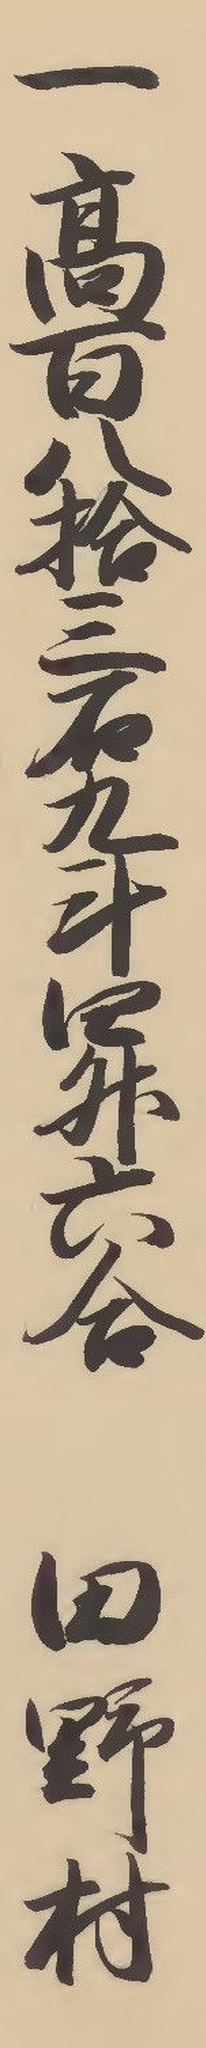一高百八拾三石九斗四升六合田野村
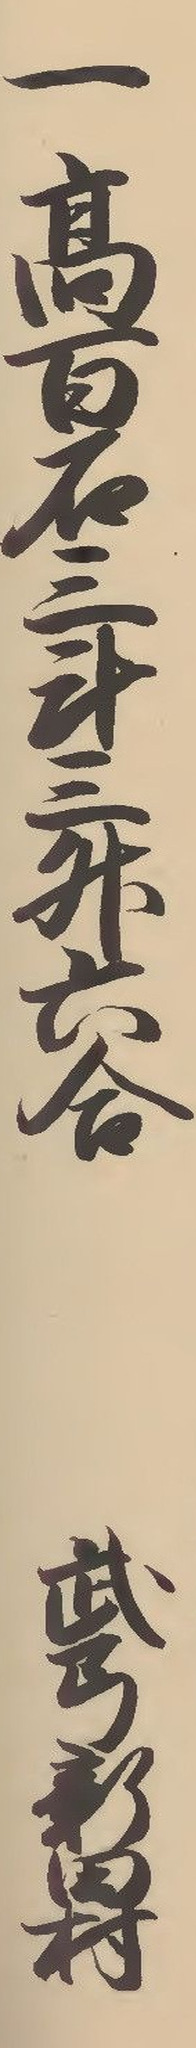一高百石三斗三升六合武弓新田村
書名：常陸国郷帳
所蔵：国立公文書館 National Archives of Japan
